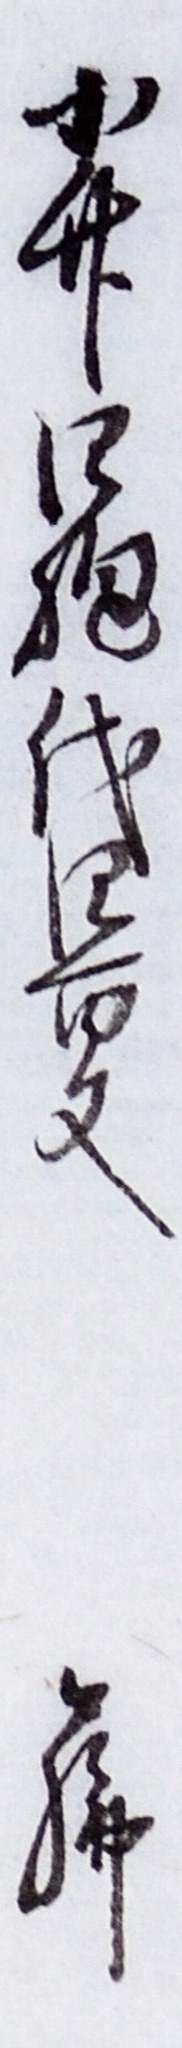小竹四抱代四百文御払
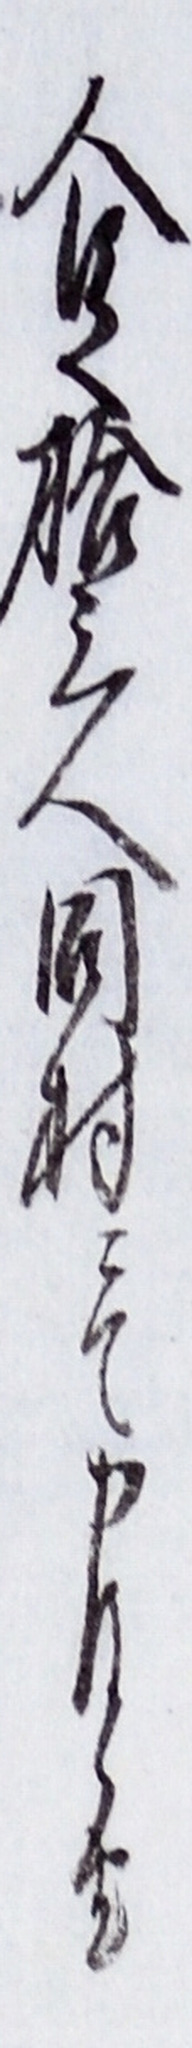人足拾三人同村ニて申付候由
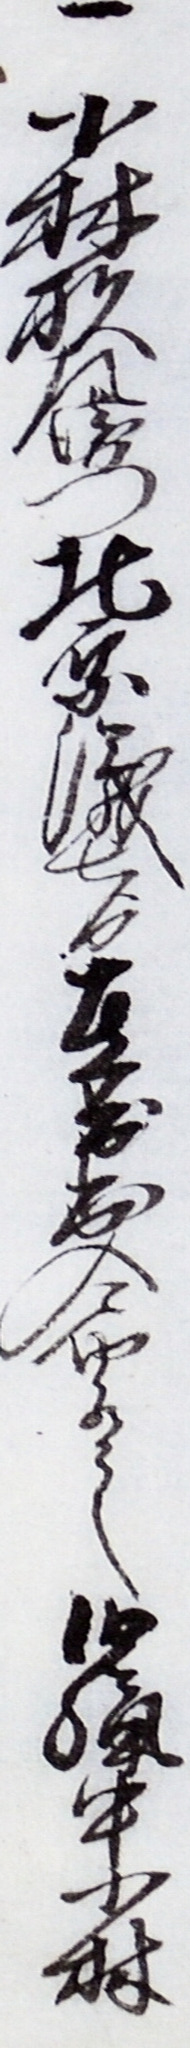一小林杉左衛門北原儀七郎在出出入届有之御領中小林
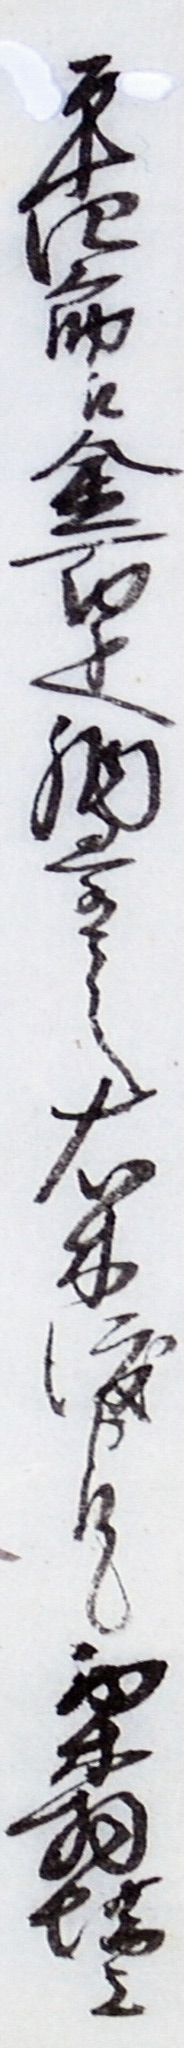平四郎江金百疋納有之右木渡申付候栗羽場迄
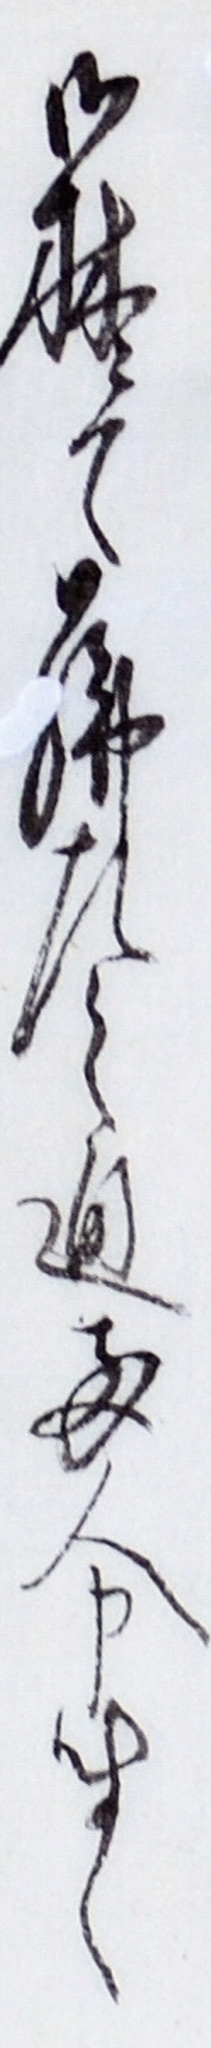御林ニて御払左之通両人申聞候
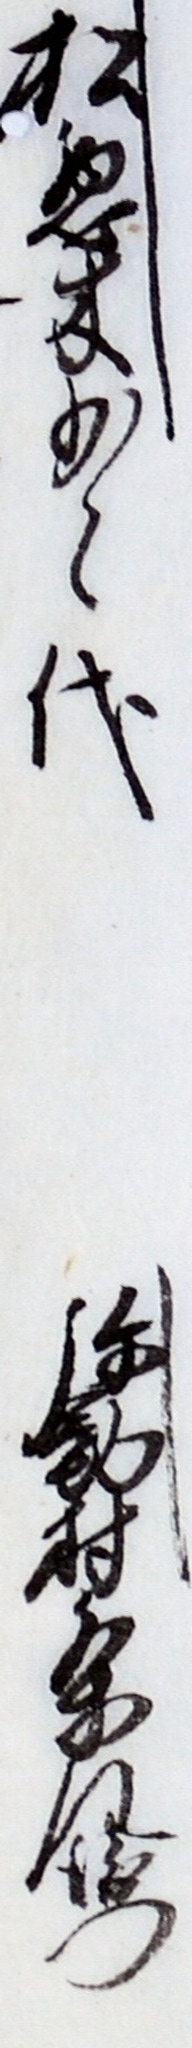松悪木少々代弥勒村条左衛門
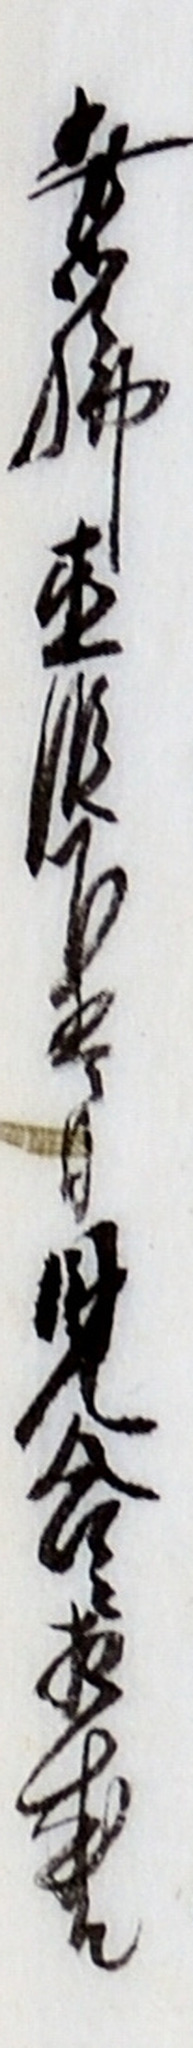此御払直段下置ニ付見合ニ相成候
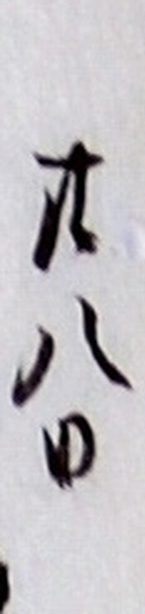廿八日
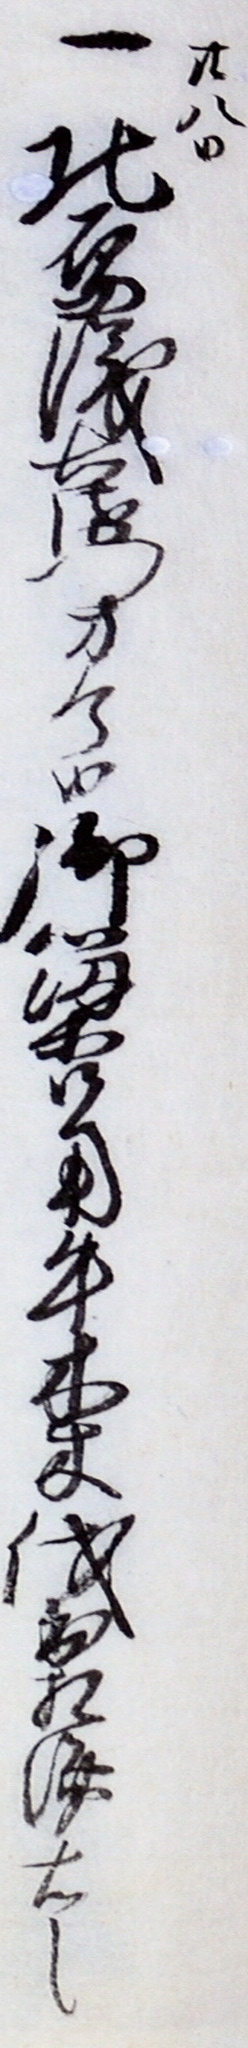一北原儀右衛門方今日御簗御用牛木伐出相済右之
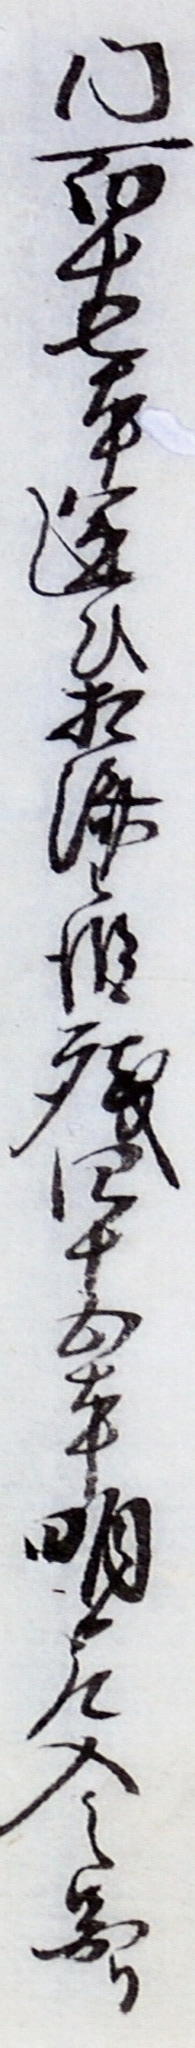内百十七本運ひ相済候段残四十五本明日取入之図り
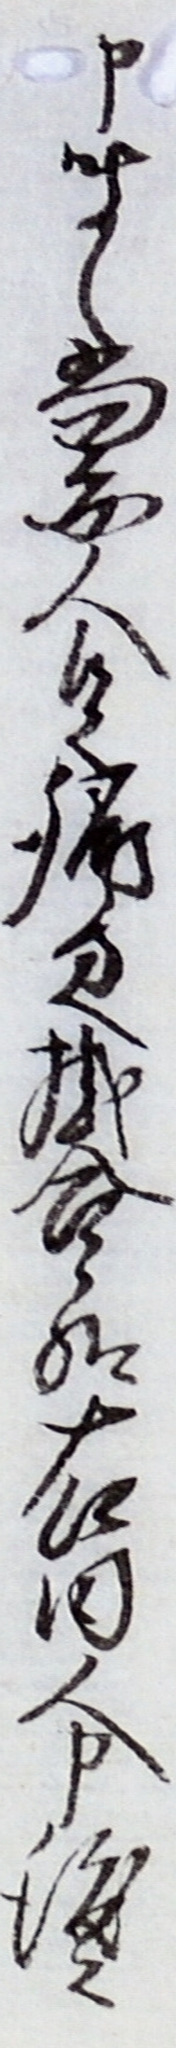申聞候尚亦人足郷方へ掛合候様右同人申渡ス
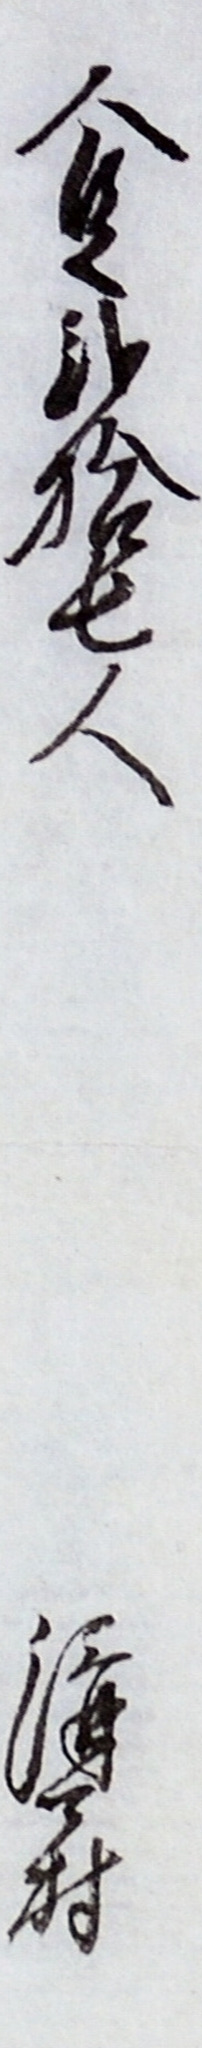人足弐拾七人溝口村
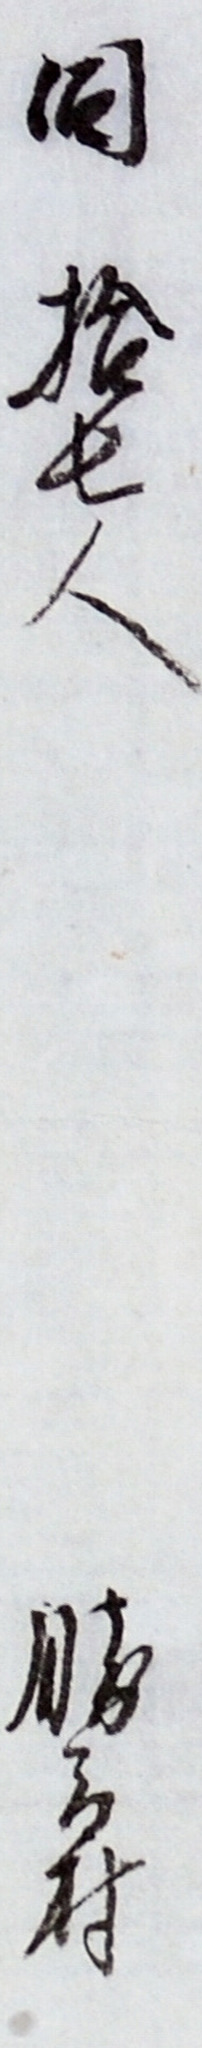内拾七人勝間村
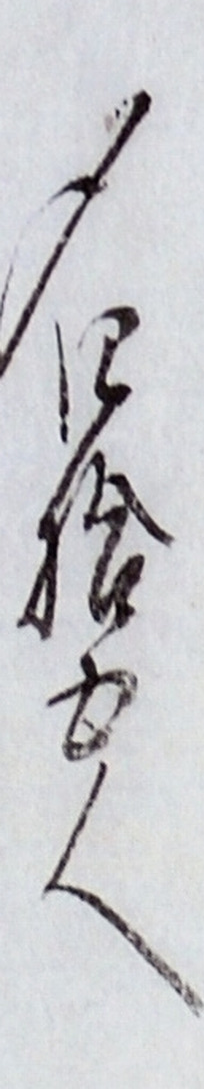〆四拾五人
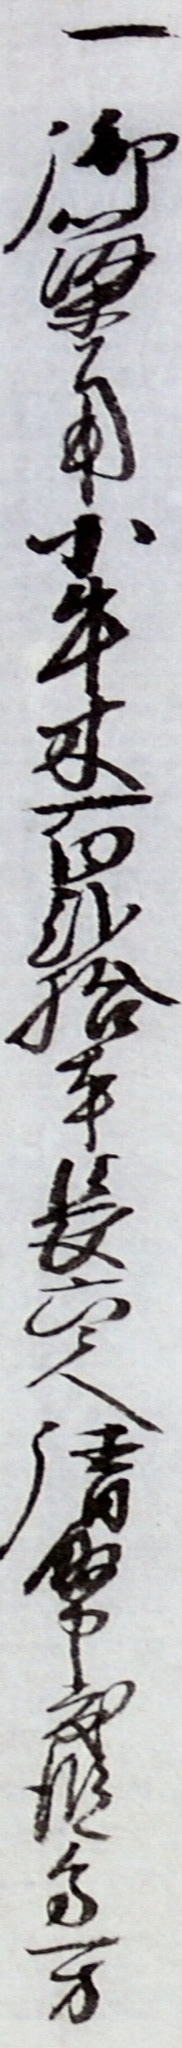一御簗御用小牛木百弐拾本長六尺請取申度段分一方
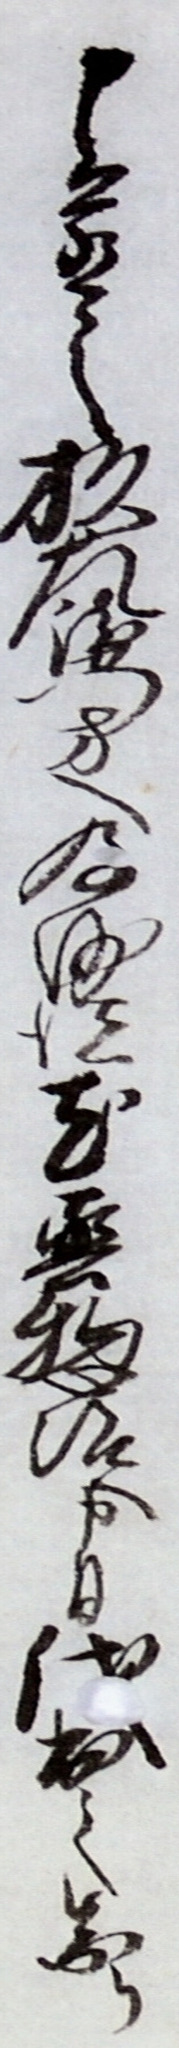申立有之杉左衛門方へ及沙汰尤与惣治へ申付伐出之図り
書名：御山奉行御用控
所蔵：伊那市立高遠町図書館・合同会社AMANE
